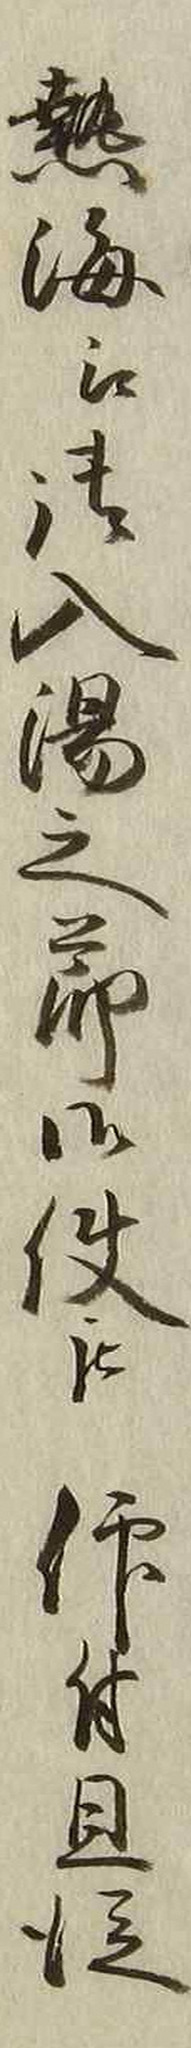熱海江御入湯之節御使被仰付且従
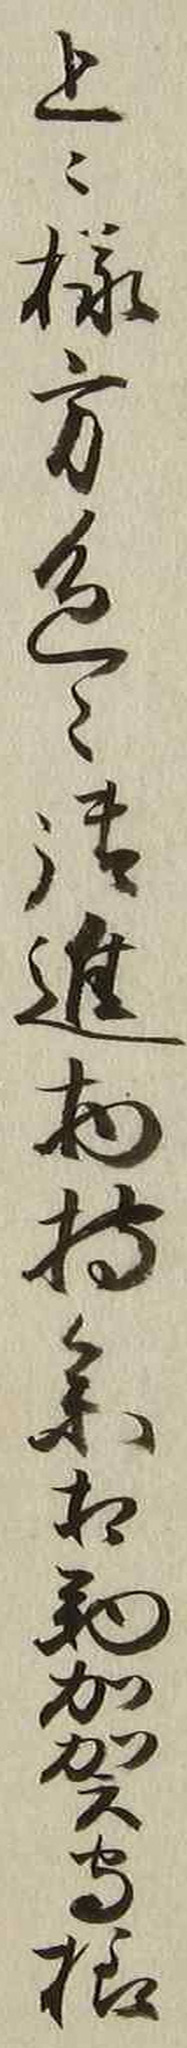上々様方色々御進物持参相勤加賀守様
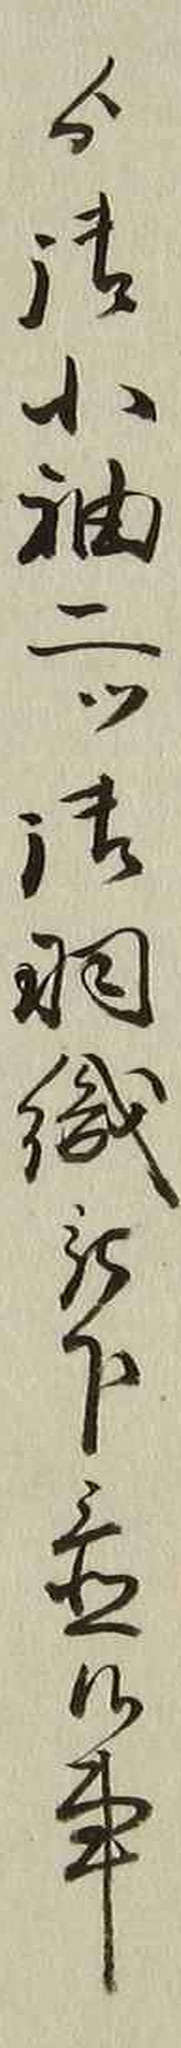ゟ御小袖二ツ御羽織被下置候事
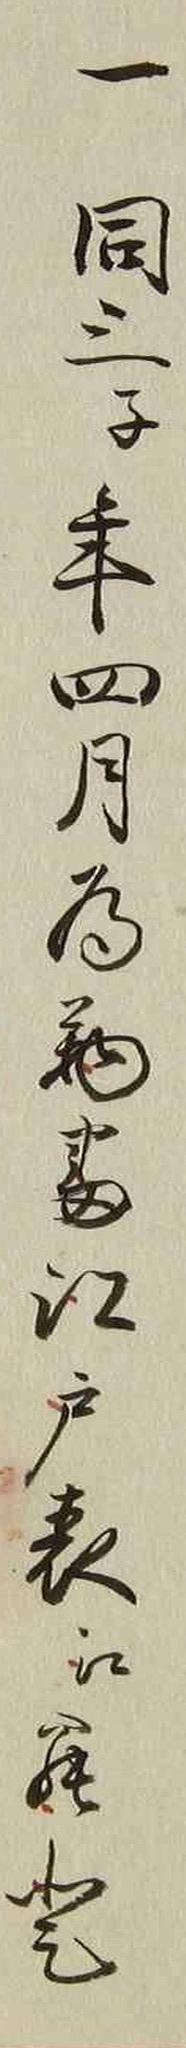一同三子年四月為勤番江戸表江罷登
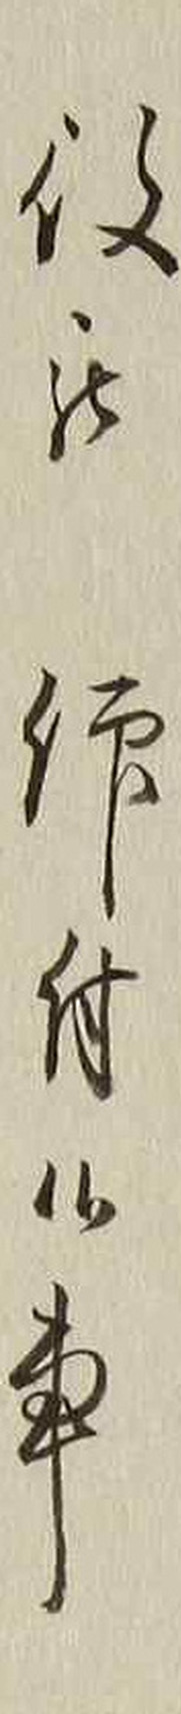役被仰付候事
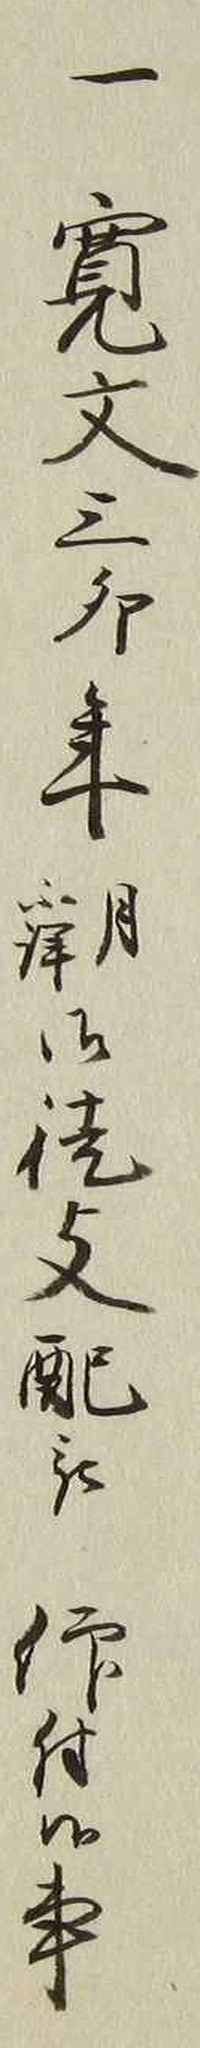一寛文三卯年月不詳御徒支配被仰付候事
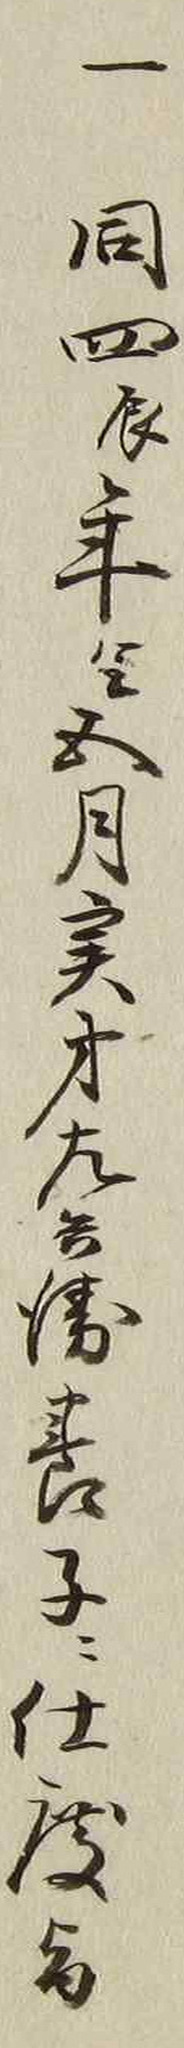一同四辰年閏五月実弟左兵衛養子ニ仕度旨
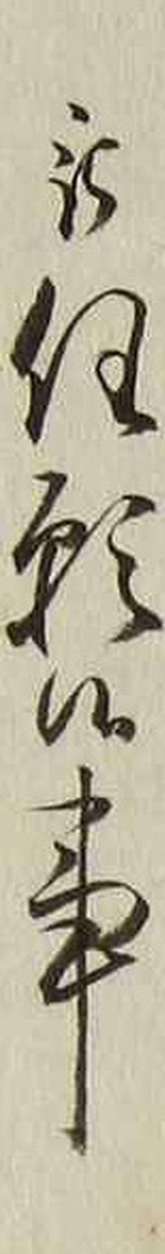被任願候事
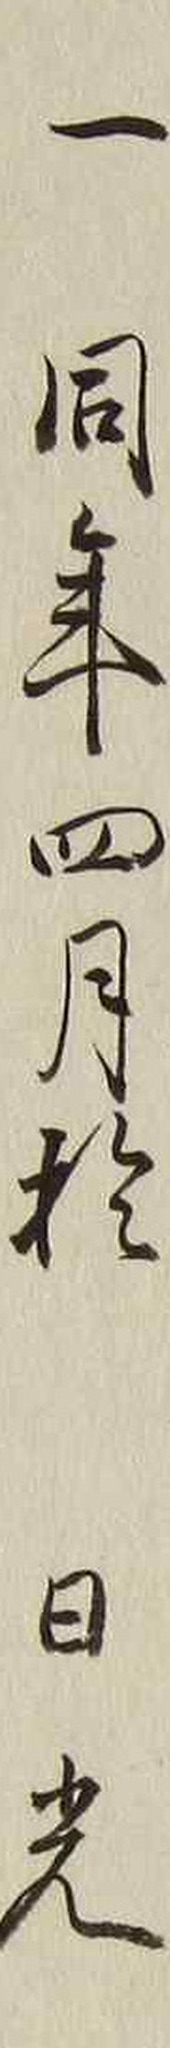一同年四月於日光
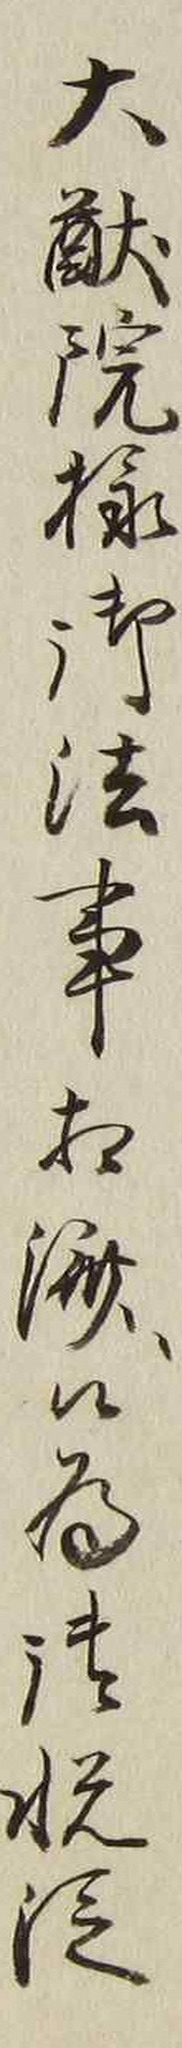大猷院様御法事相済候為御悦従
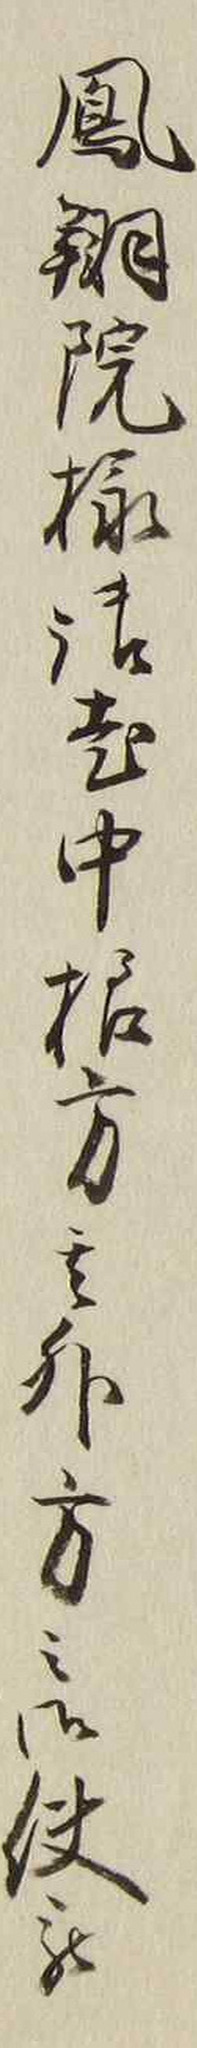鳳翔院様御老中様方其外方之御使被

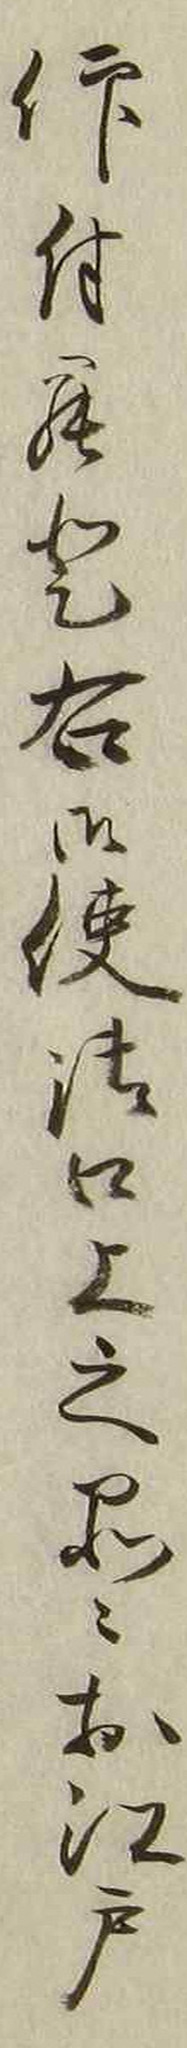仰付罷登右御使御口上之品々於江戸
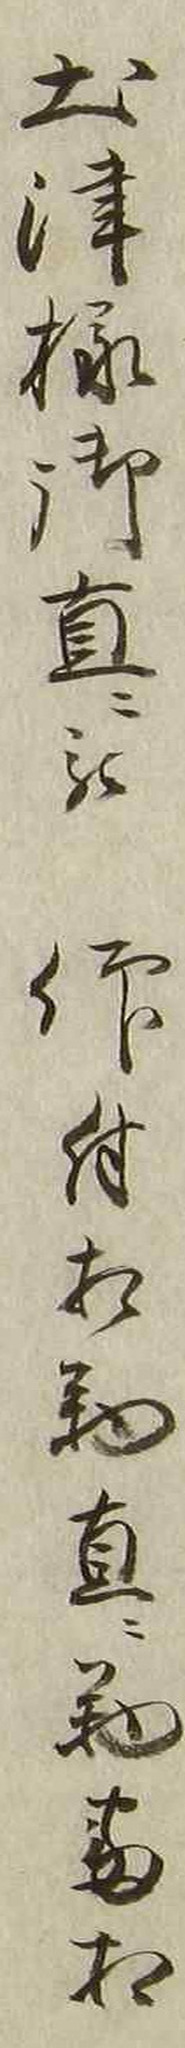土津様御直ニ被仰付相勤直ニ勤番相
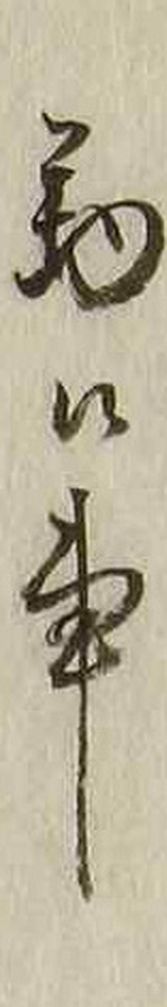勤候事
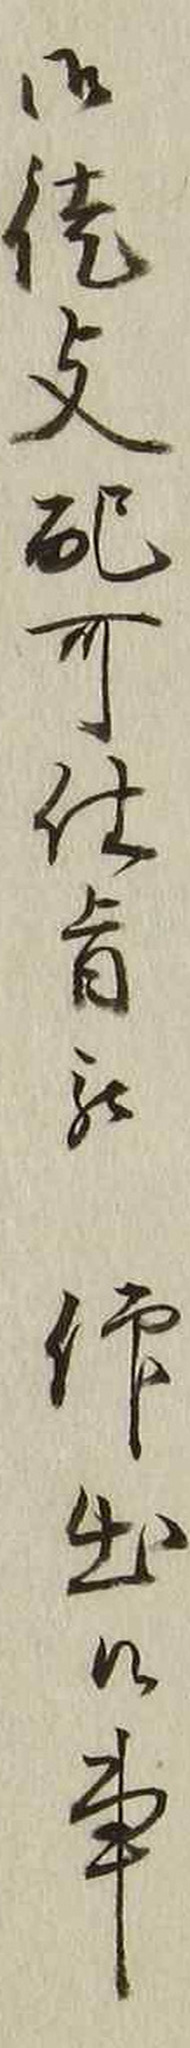御徒支配可仕旨被仰出候事
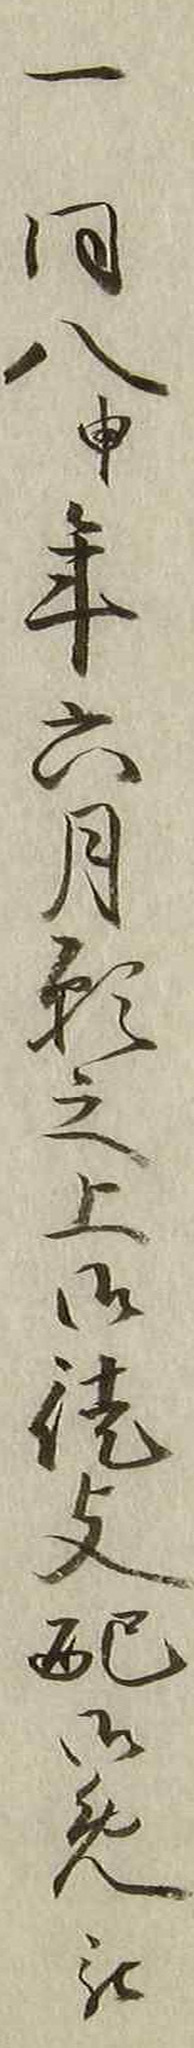一同八申年六月願之上御徒支配御免被
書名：諸士系譜　巻之15　い之部15
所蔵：会津若松市立会津図書館
